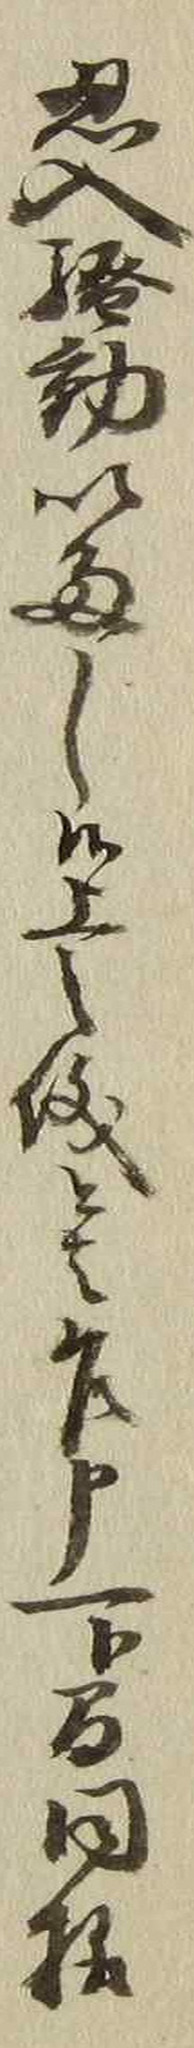忍入騒動いたし候上之儀と者乍申一ト間同様
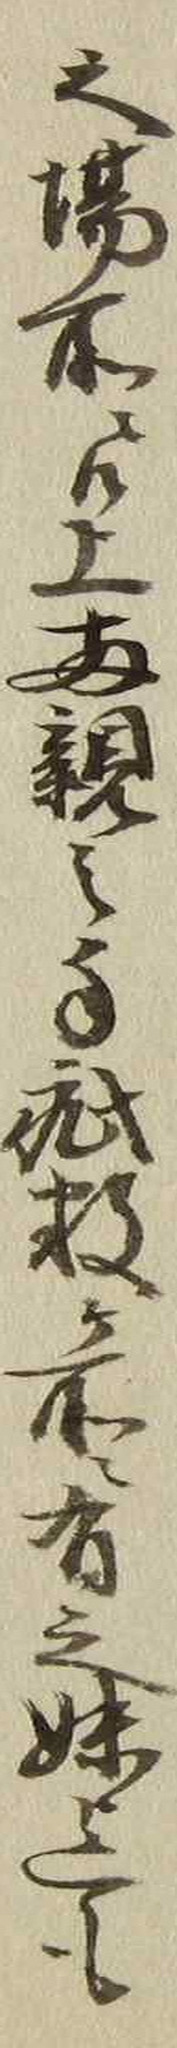之場所ニ候上両親之手疵数ヶ所ニ有之妹迄も
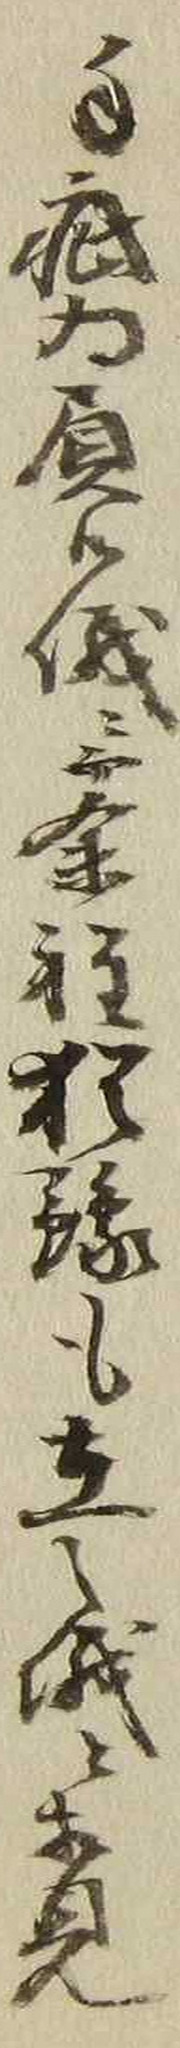手疵負候儀ニ而余程猶予も在之儀と相見
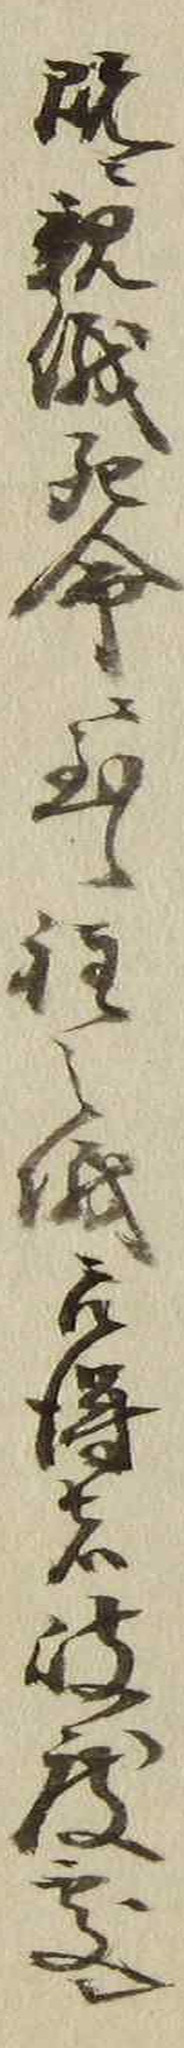既ニ親儀死命ニ至候程之儀ニ候得者跂度處シ
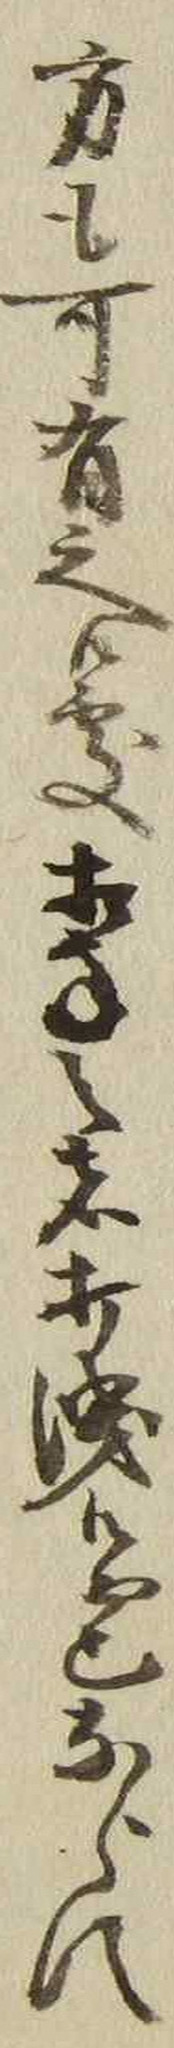方も可有之候處相手之者打洩候而已ならす
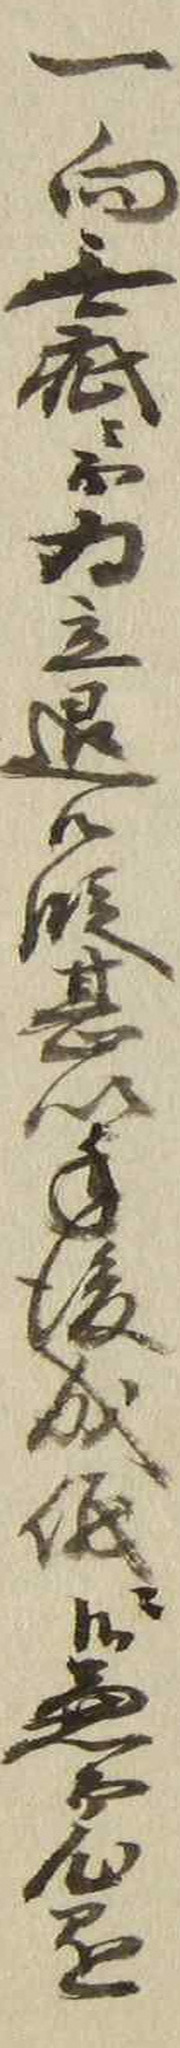一向無疵ニ而為立退候段甚以年後成儀ニ候兼而心懸
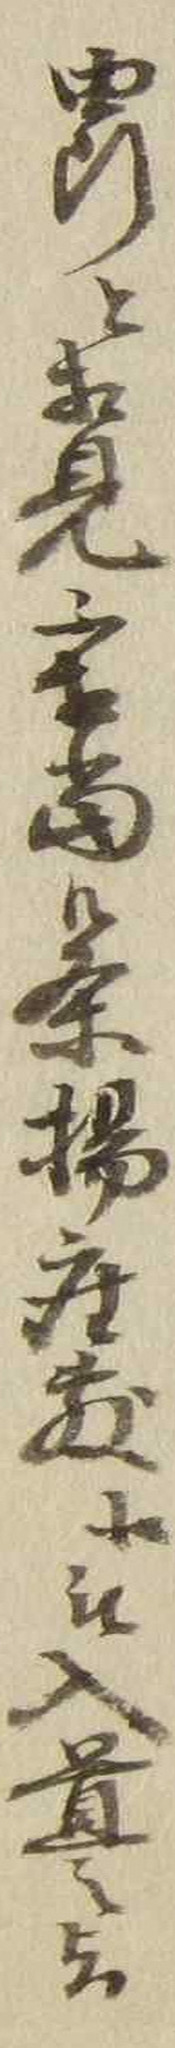由行と相見不相当候条揚座敷江被入置之旨
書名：諸士系譜　巻之64　と之部7
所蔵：会津若松市立会津図書館
